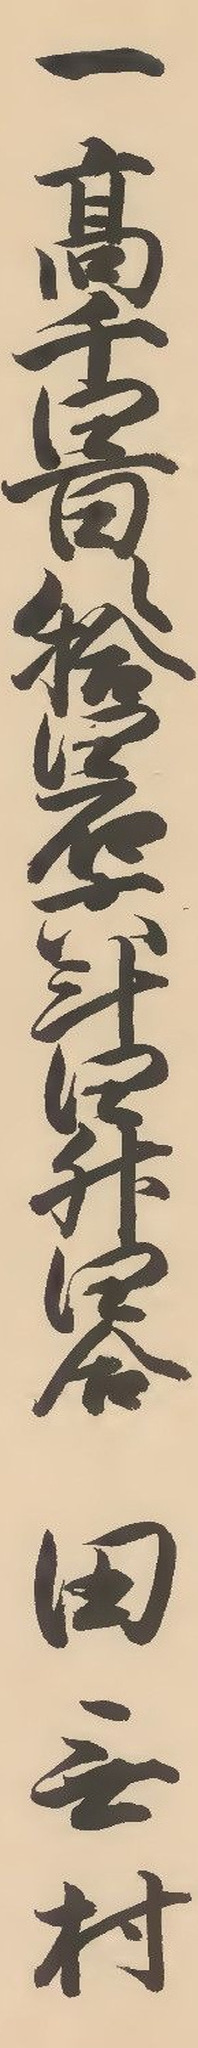一高千四百八拾四石六斗四升四合田無村
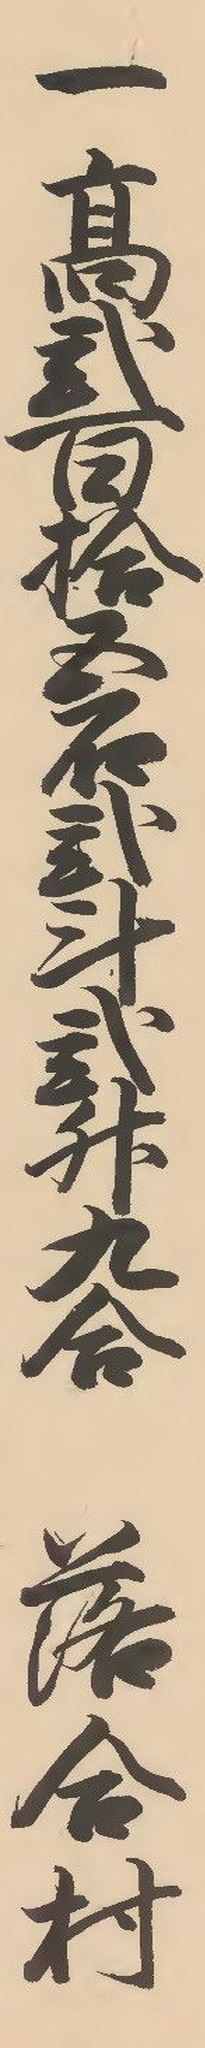一高弐百拾五石弐斗弐升九合落合村
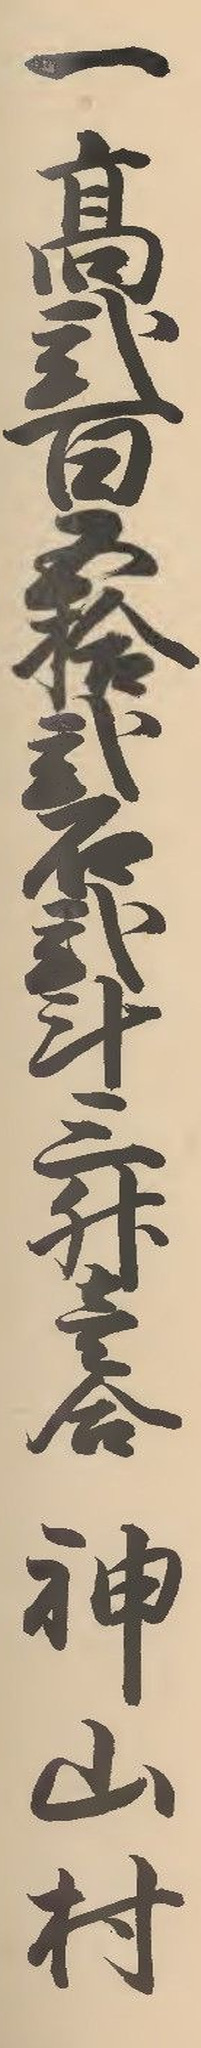一高弐百五拾弐石弐斗三升壱合神山村
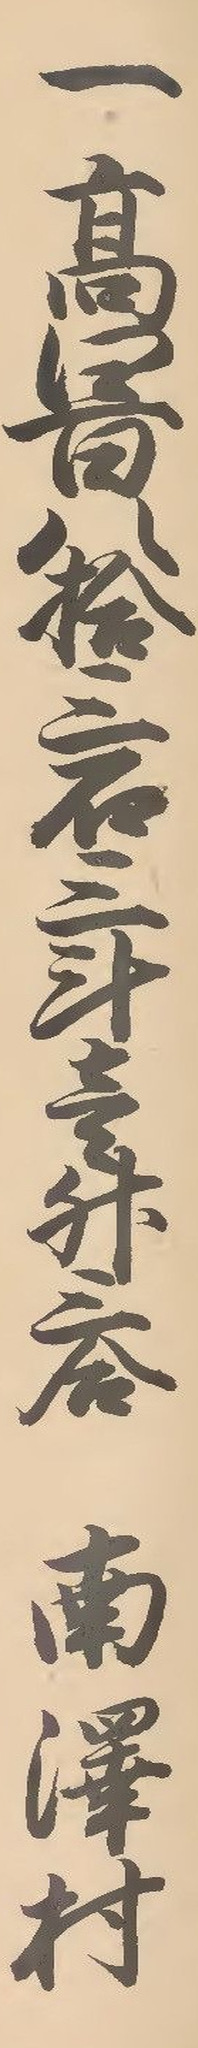一高四百八拾三石三斗壱升三合南澤村
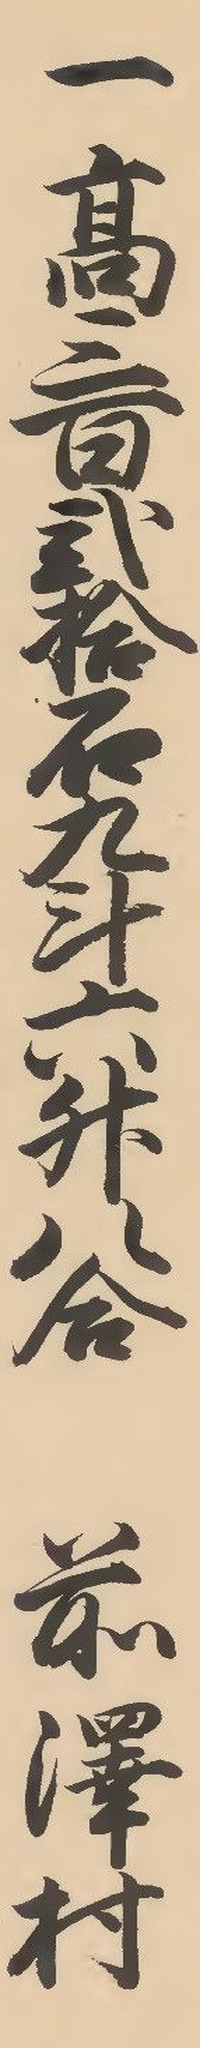一高三百弐拾石九斗六升八合前澤村
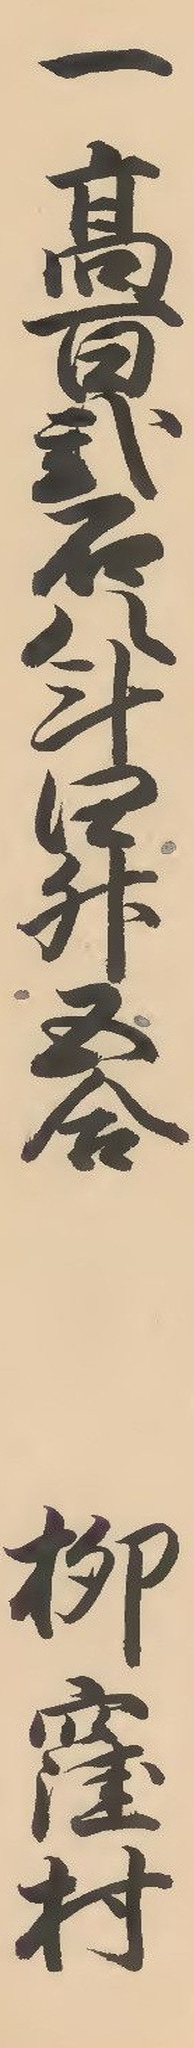一高百弐石八斗四升五合柳窪村

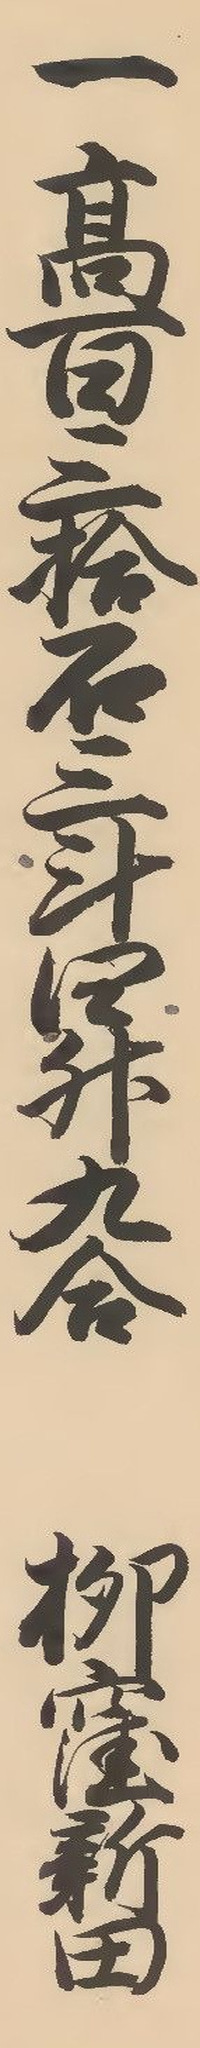一高百三拾石三斗四升九合柳窪新田
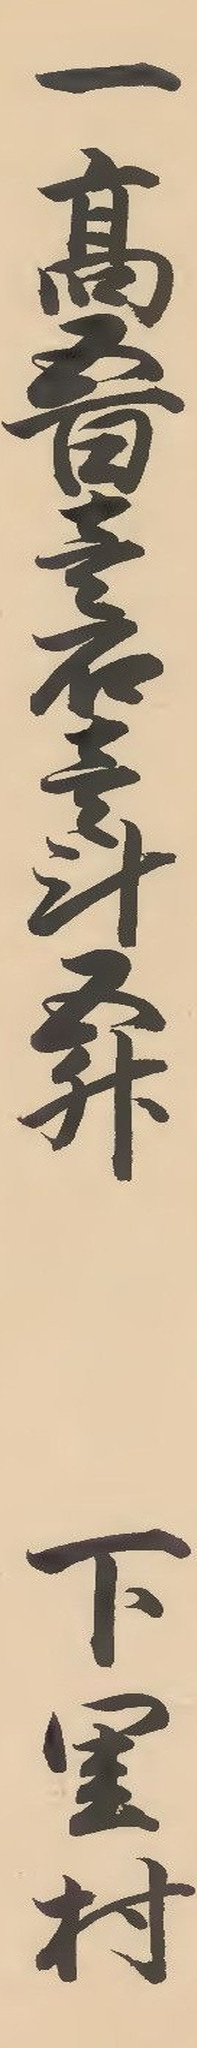一高五百壱石壱斗五升下里村
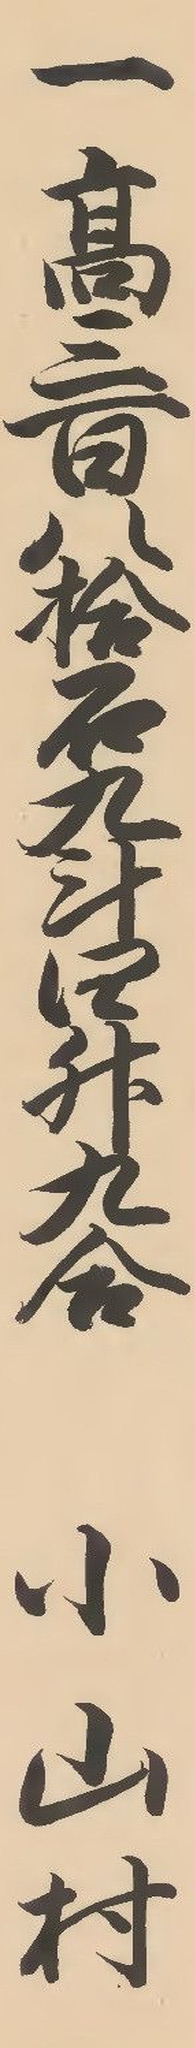一高三百八拾石九斗四升九合小山村
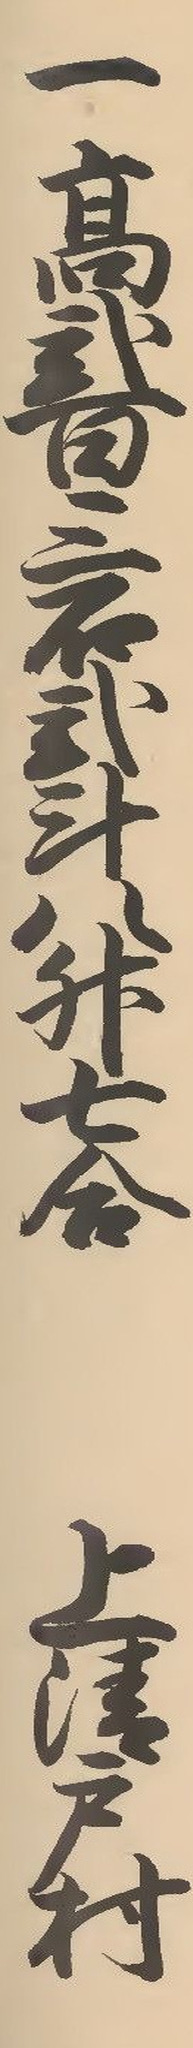一高弐百三石弐斗八升七合上清戸村
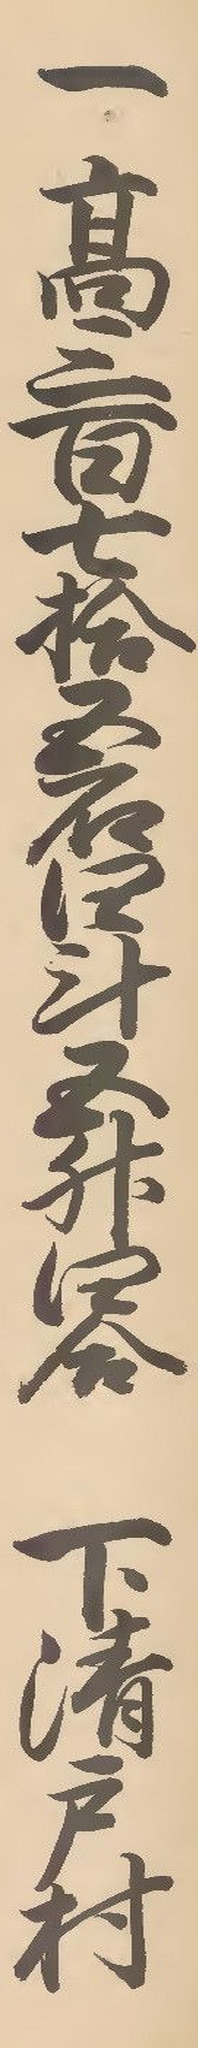一高三百七拾五石四斗五升四合下清戸村
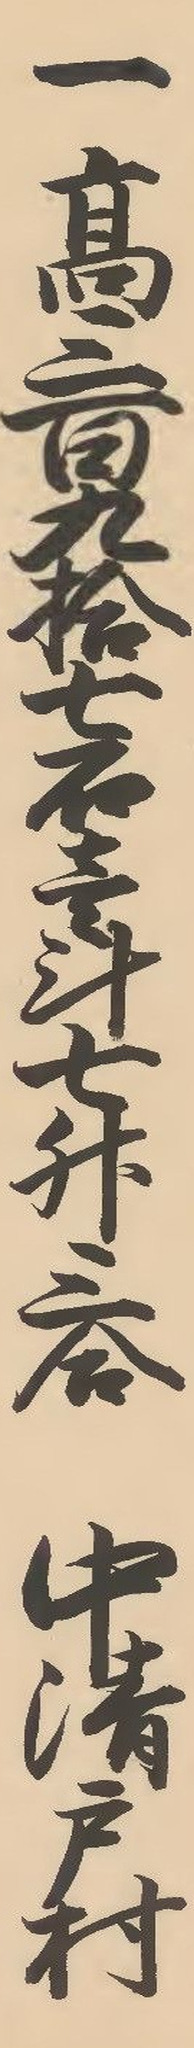一高三百九拾七石壱斗七升三合中清戸村
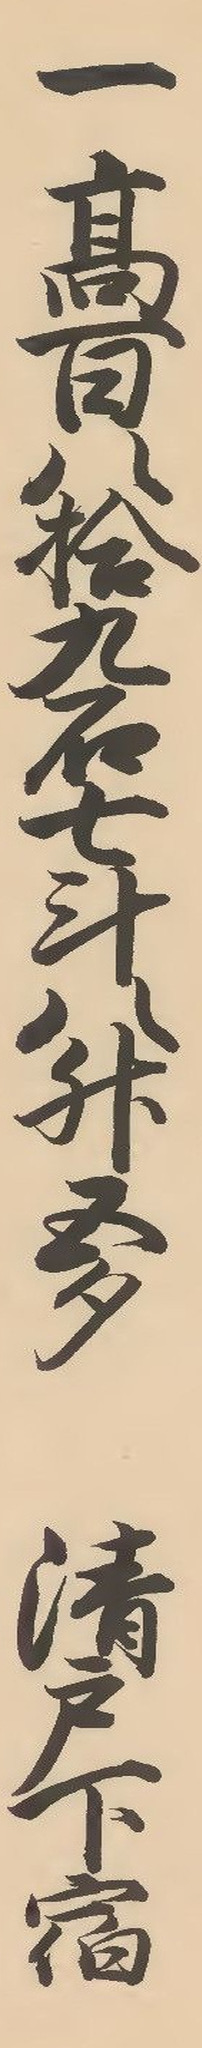一高百八拾九石七斗八升五勺清戸下宿

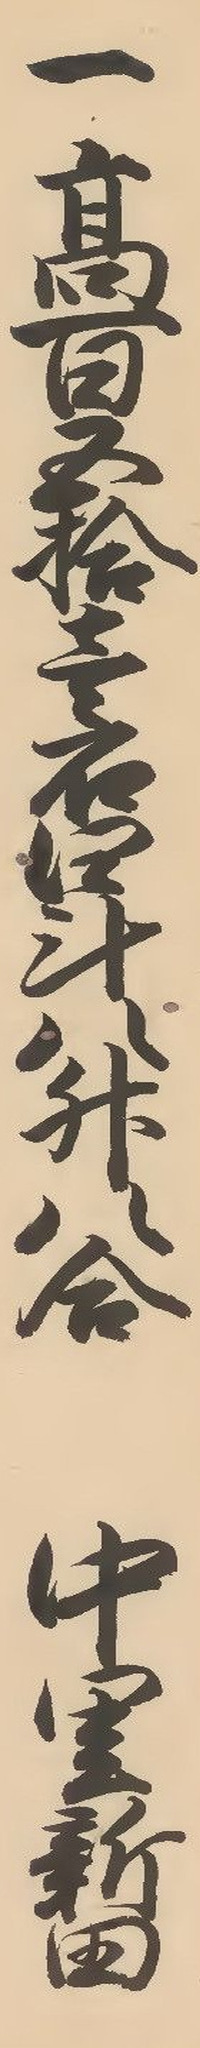一高百五拾壱石四斗八升八合中里新田
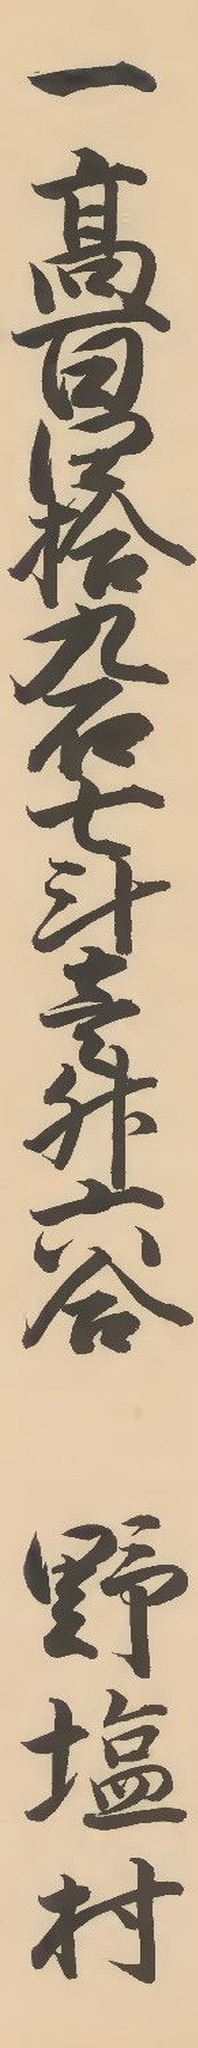一高百四拾九石七斗壱升六合野塩村
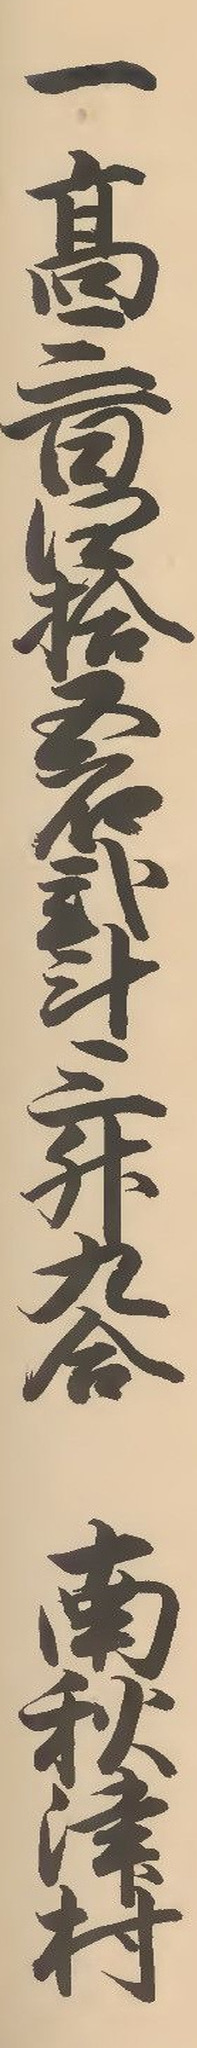一高三百四拾五石弐斗三升九合南秋津村
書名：武蔵国郷帳　上
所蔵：国立公文書館 National Archives of Japan
